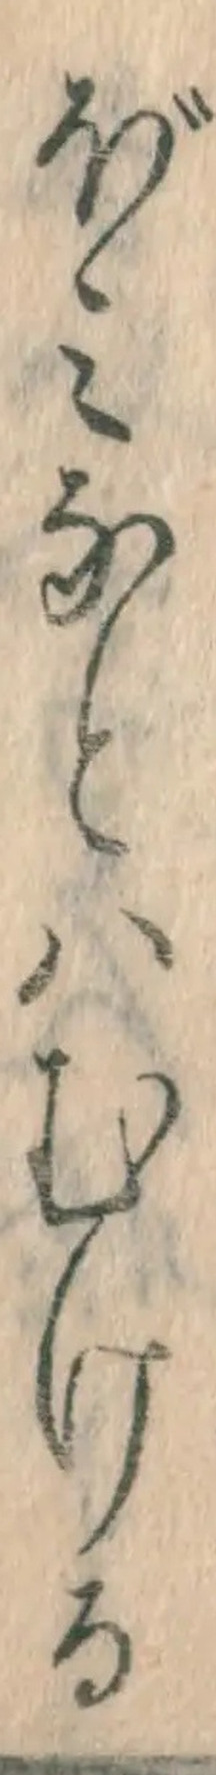ぼみなとはむける
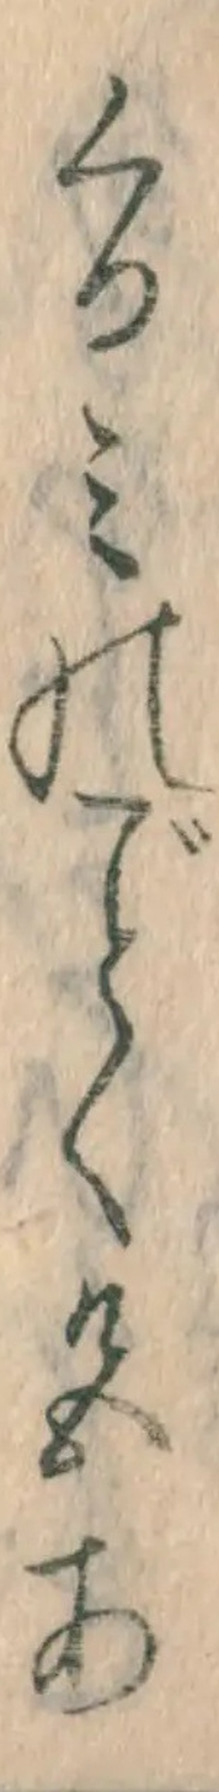くるみのごとく色あ

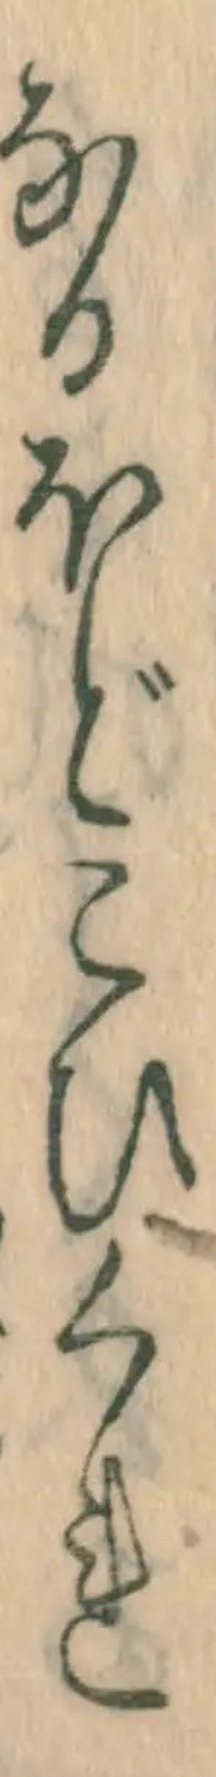なるほどこひくれ
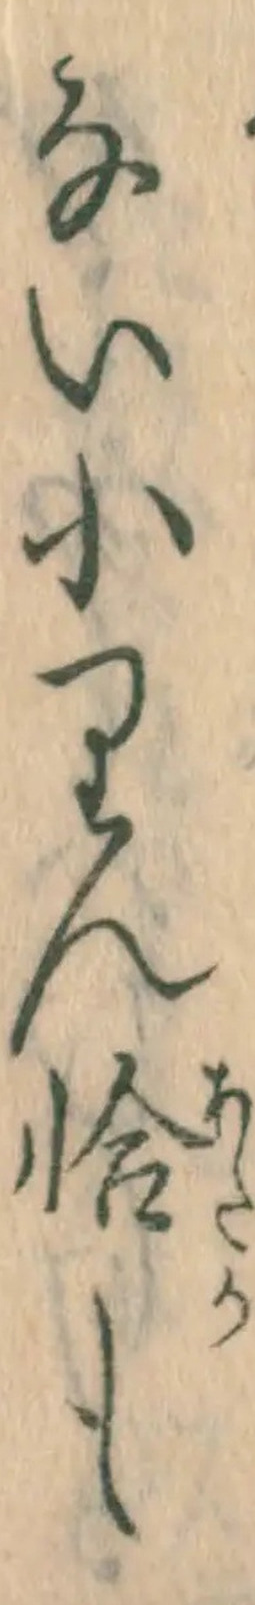ない小りん恰も
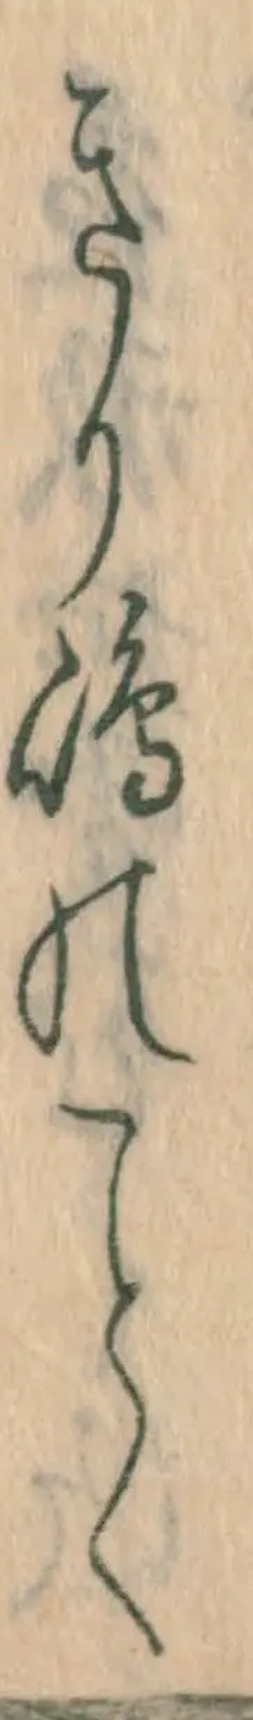きり嶋のことく
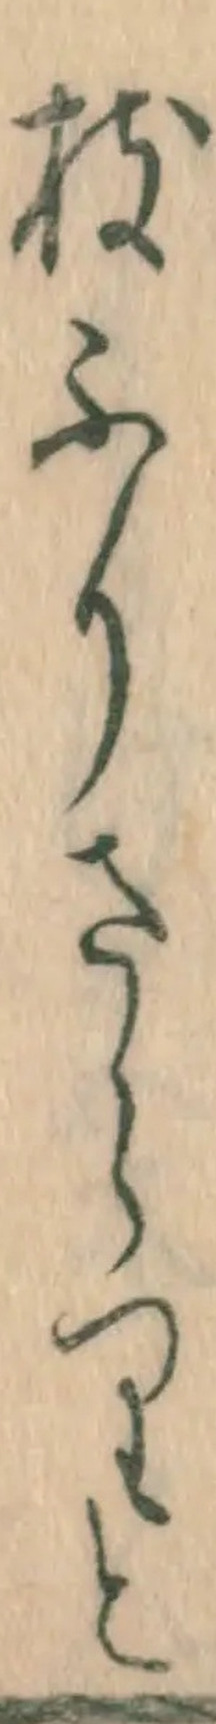枝ふりさらりと
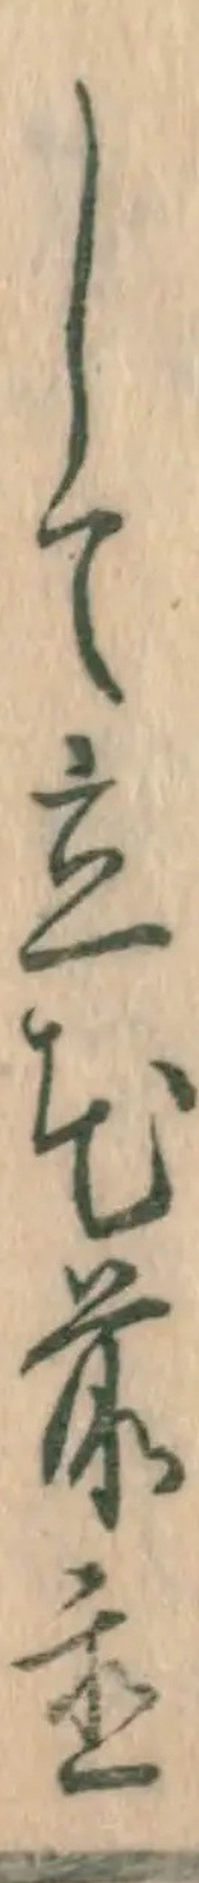して立花前置
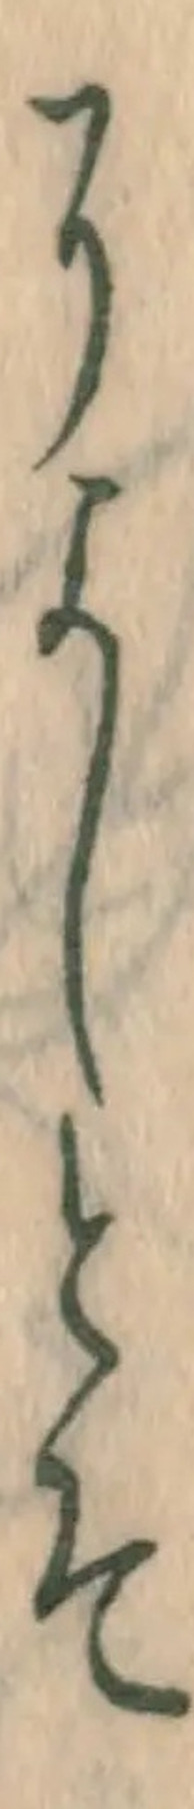によしとそ
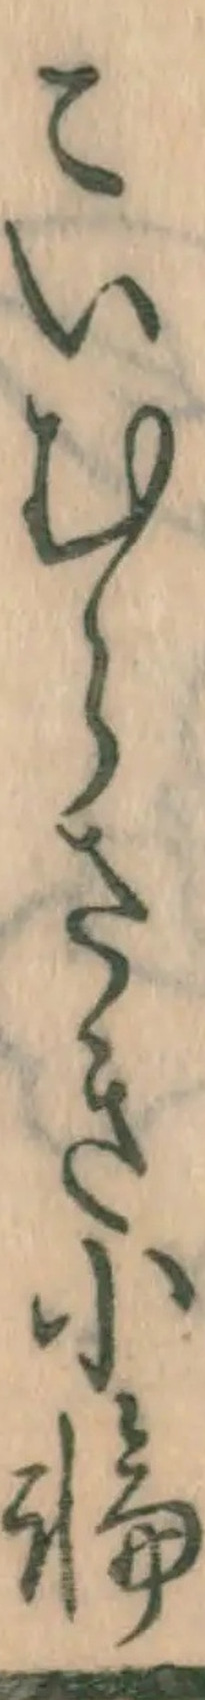こいむらさき小輪

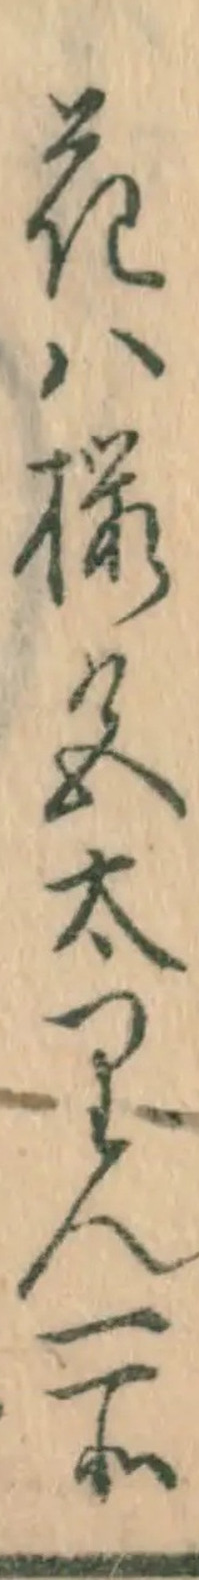花は桜色太りん一所
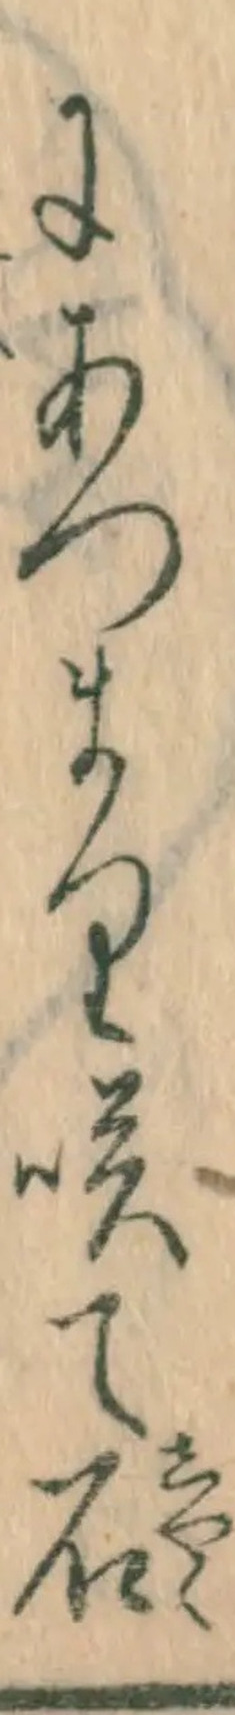にあつまり咲て石
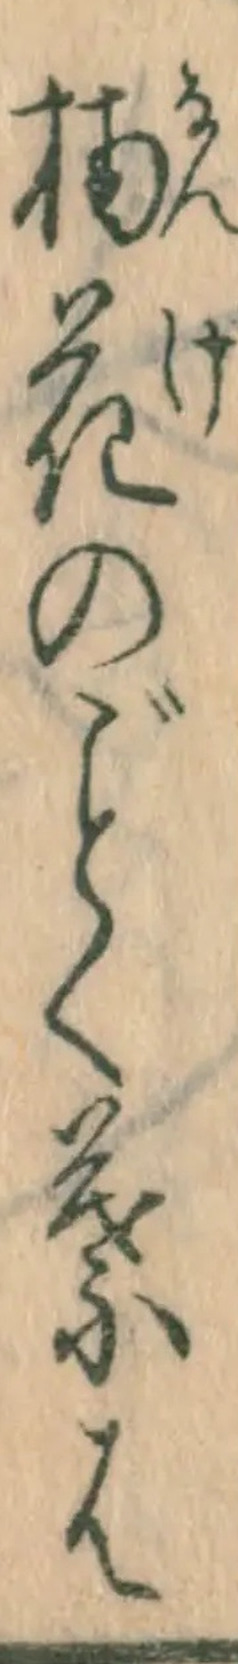楠花のごとく葉は
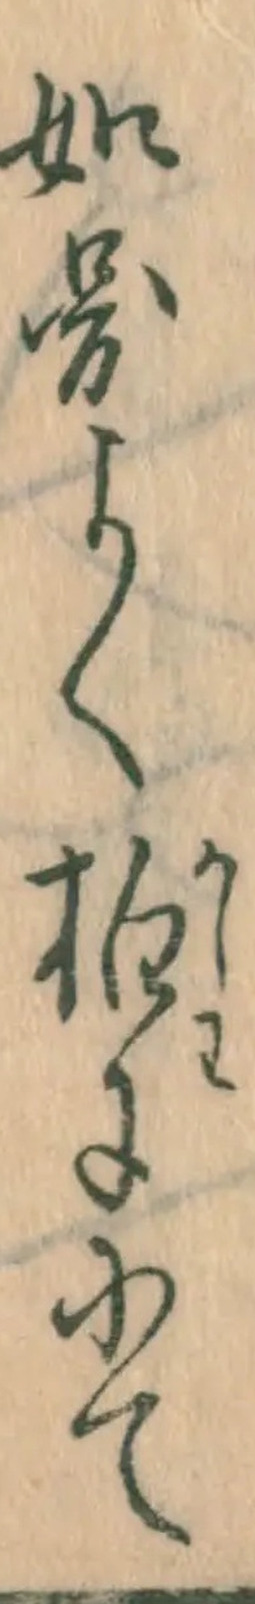如図よく柏ににて
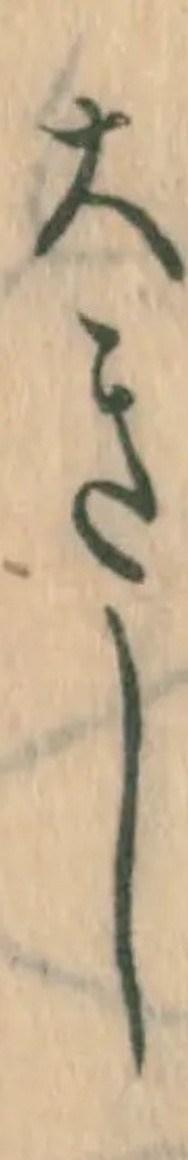大きし
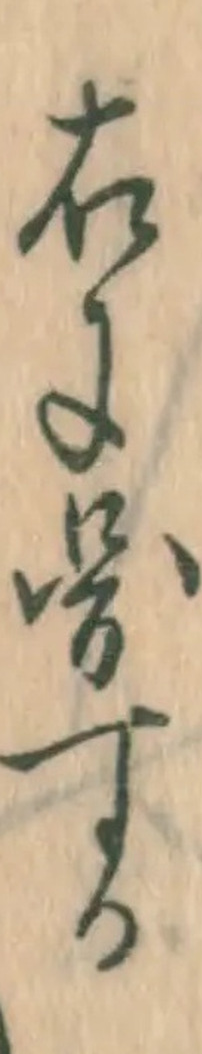右に図する
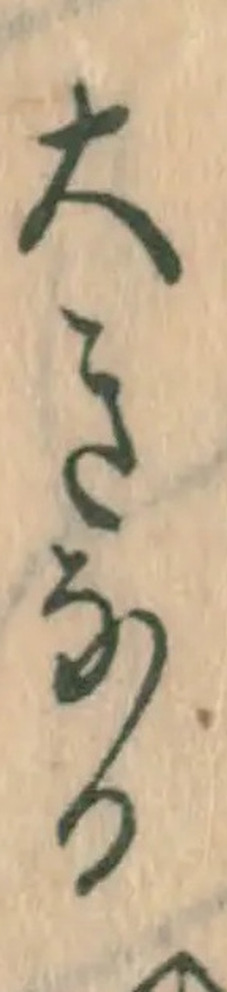大きなる
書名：錦繍枕 5巻. [3]
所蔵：国立国会図書館 National Diet Library, JAPAN
